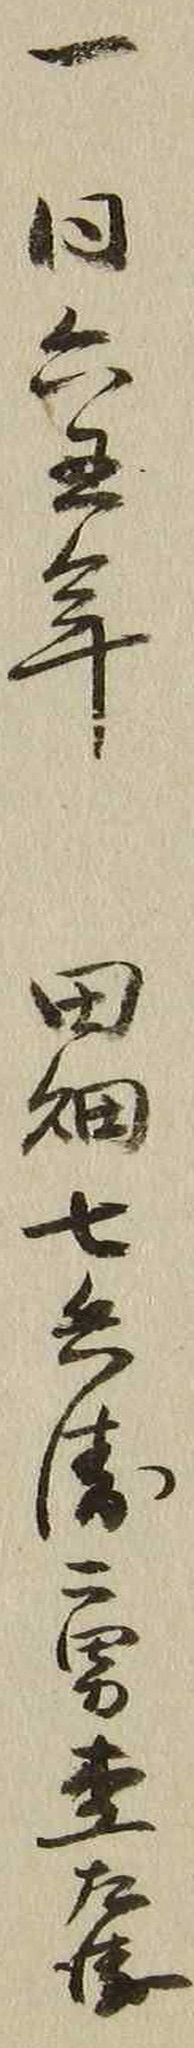一同六丑年田畑七兵衛二男杢左衛
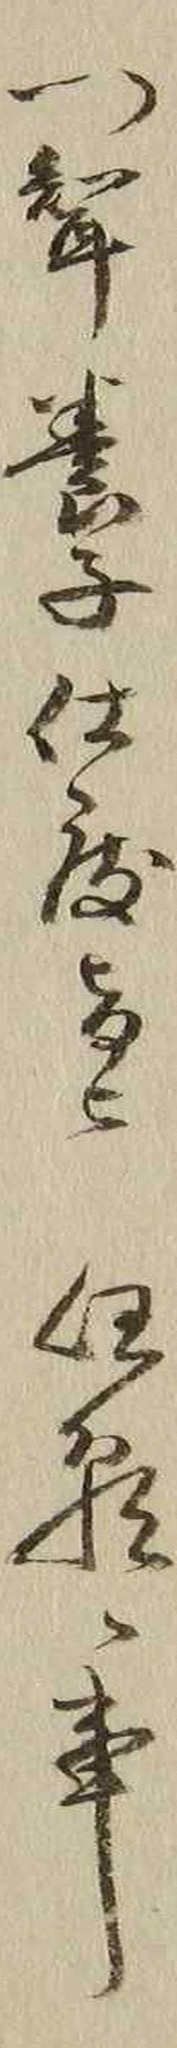門婿養子仕度旨被任願候事
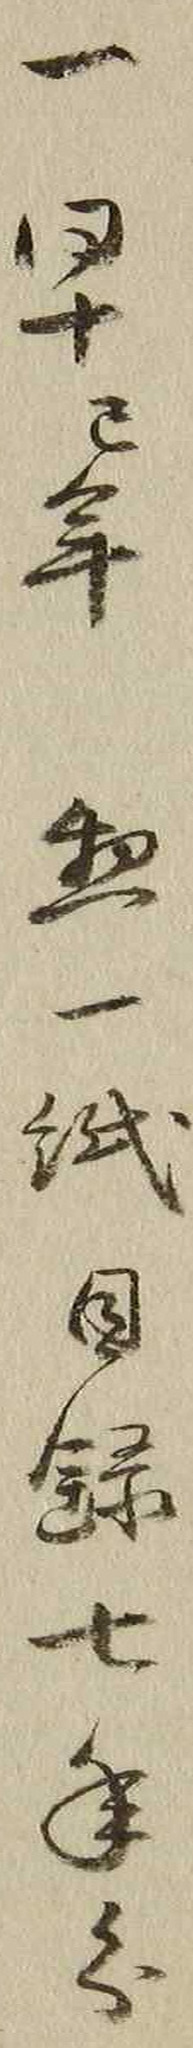一同十巳年惣一紙目録七年分
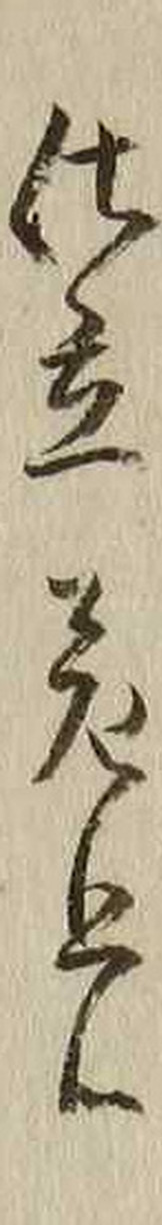仕立差上候
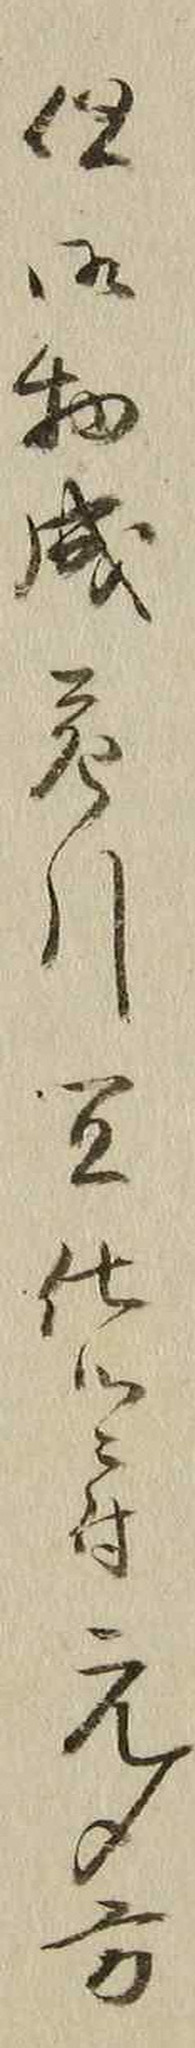但御物成差引宜仕候ニ付元〆方
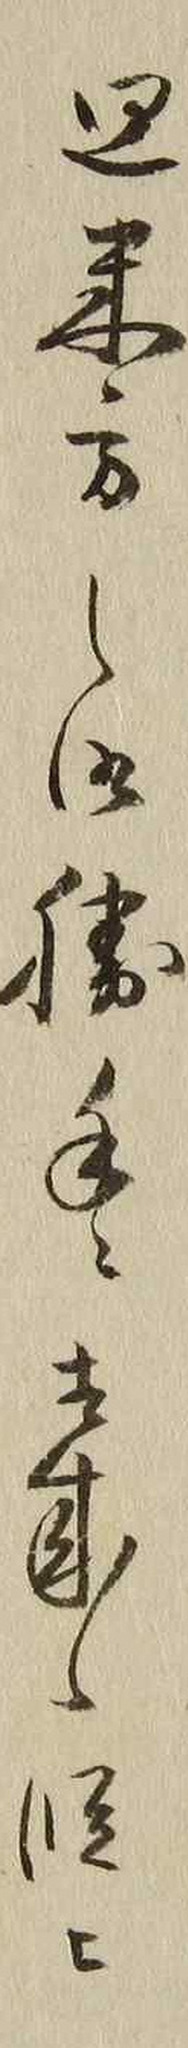廻米方之御勝手ニ相成候段被
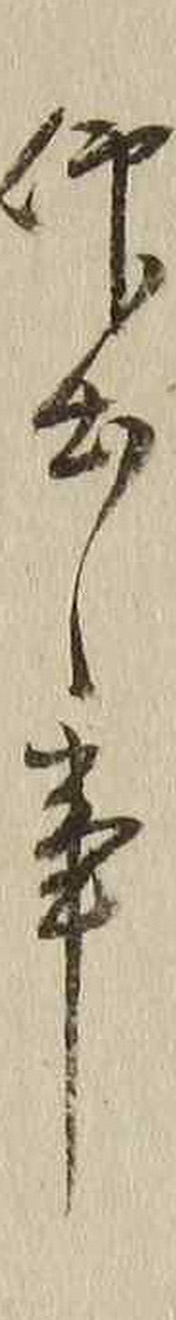仰出候事
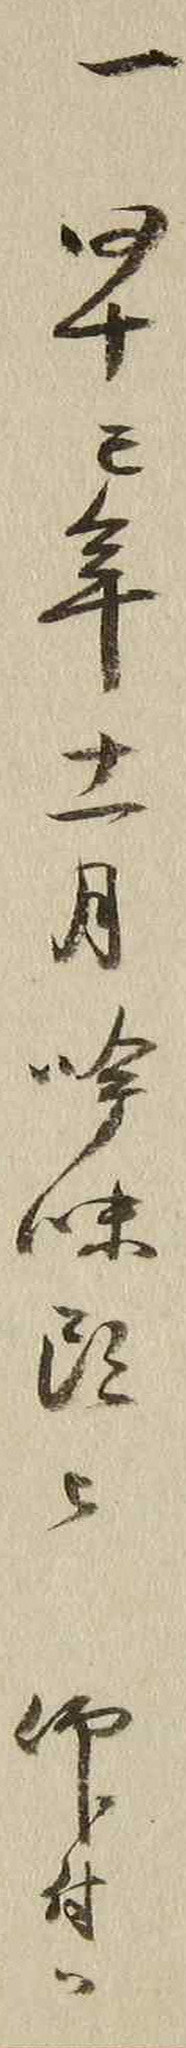一同十巳年十一月吟味頭被仰付候
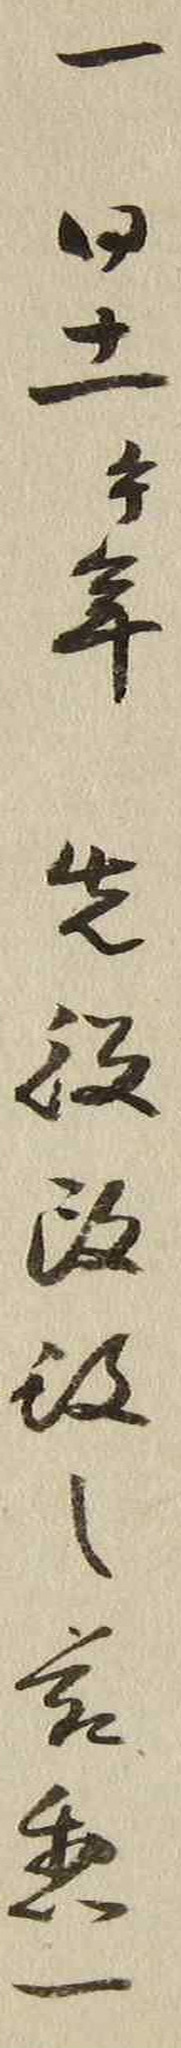一同十一午年先役改役之節惣一
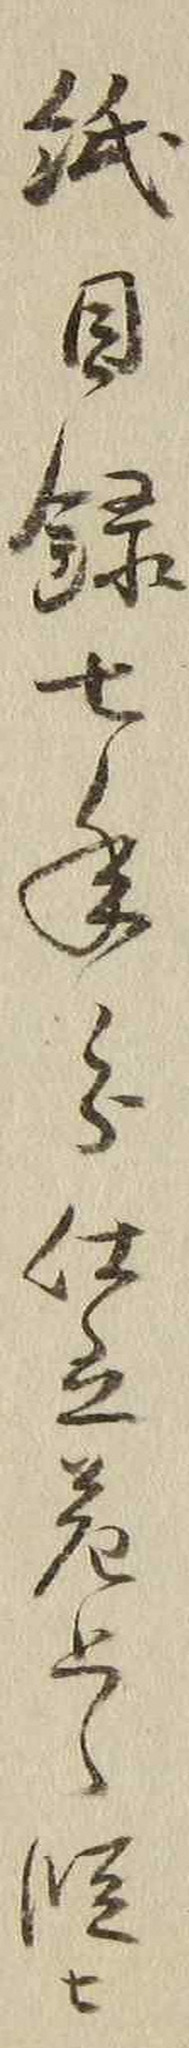紙目録七年分仕立差上候段被
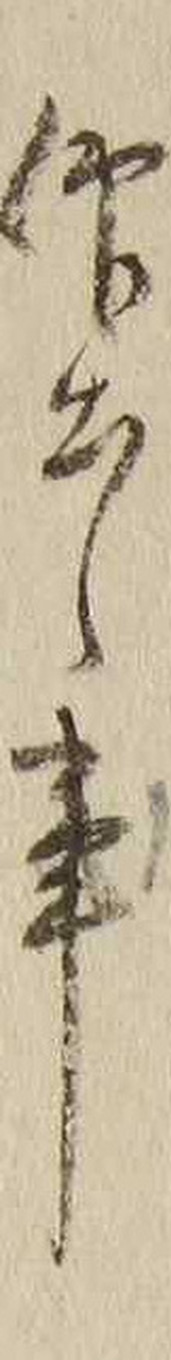仰出候事
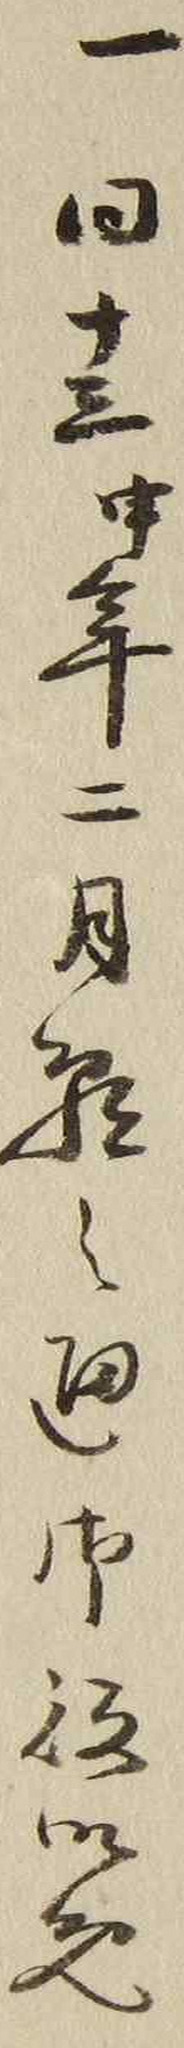一同十三申年二月願之通御役御免
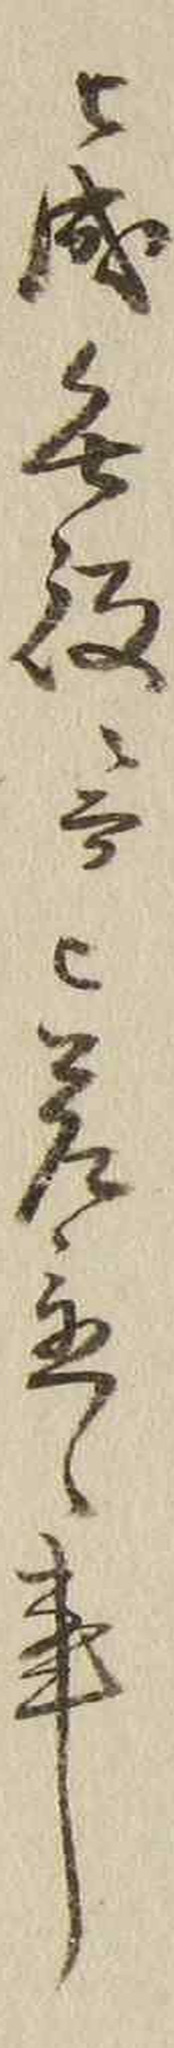被成無役ニ而被差置候事
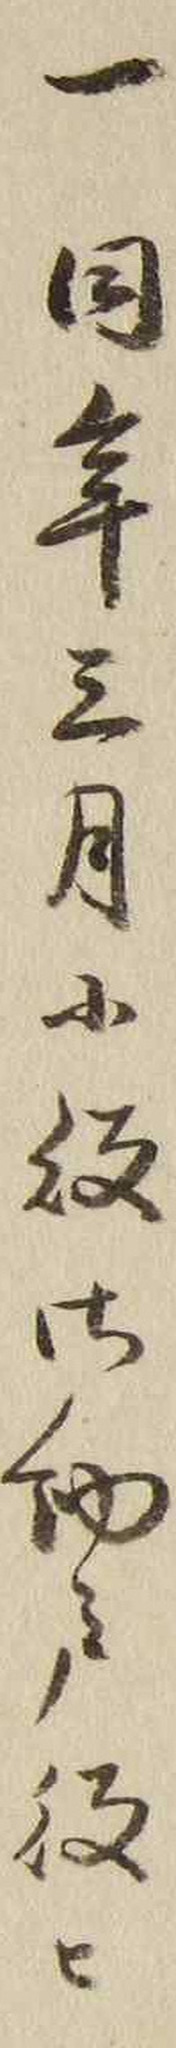一同年三月小役御納戸役被

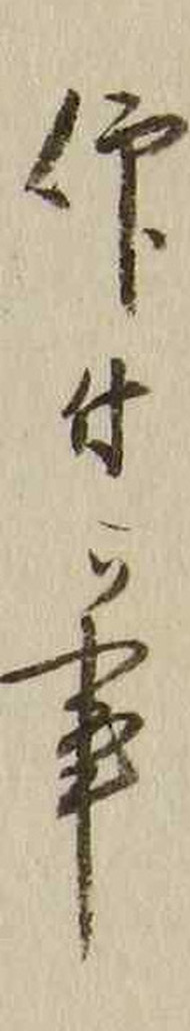仰付候事
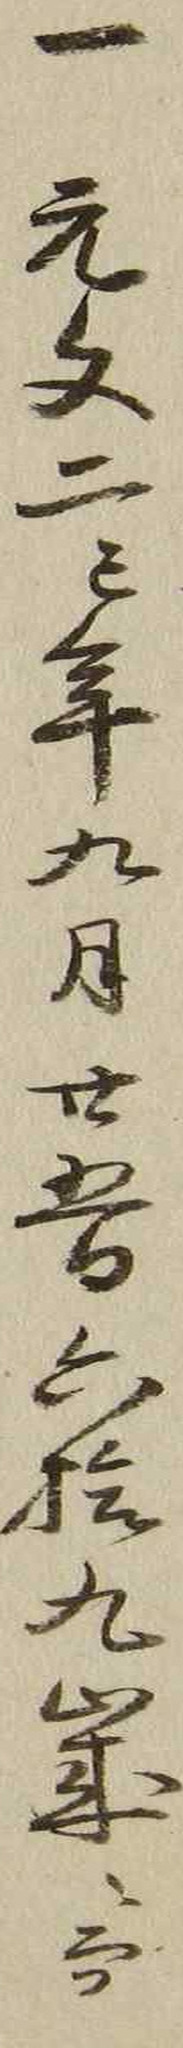一元文二巳年九月廿五日六拾九歳ニ而
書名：諸士系譜　巻之236　ふ之部4
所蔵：会津若松市立会津図書館
